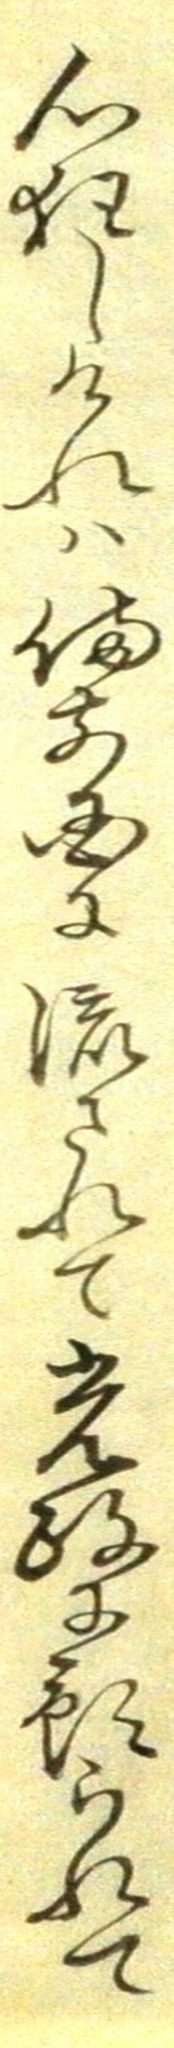心狂しけれは備前国に流されて光政に預られて
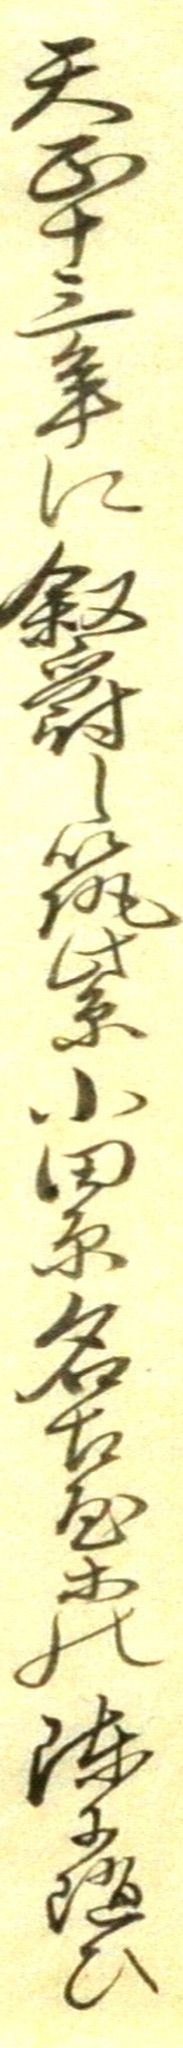天正十三年に叙爵し筑紫小田原名古屋等の陣に随ひ
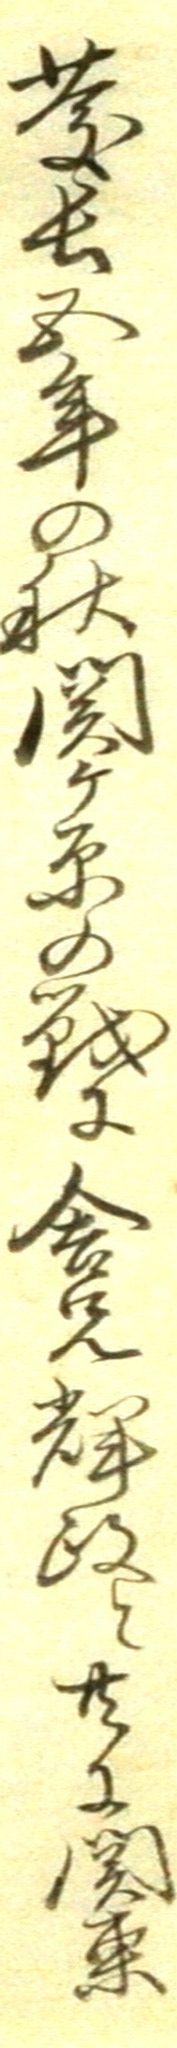慶長五年の秋関ヶ原の戦に舎兄輝政と共に関東
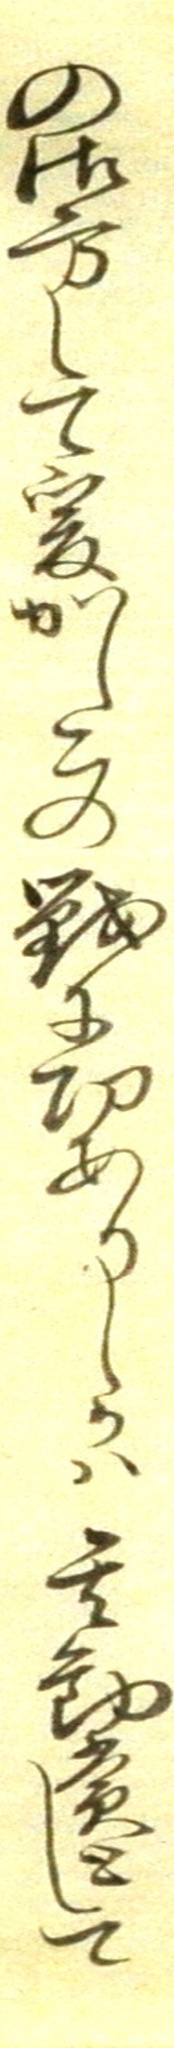の御方して爰かしこの戦に功ありしかは其勧賞として
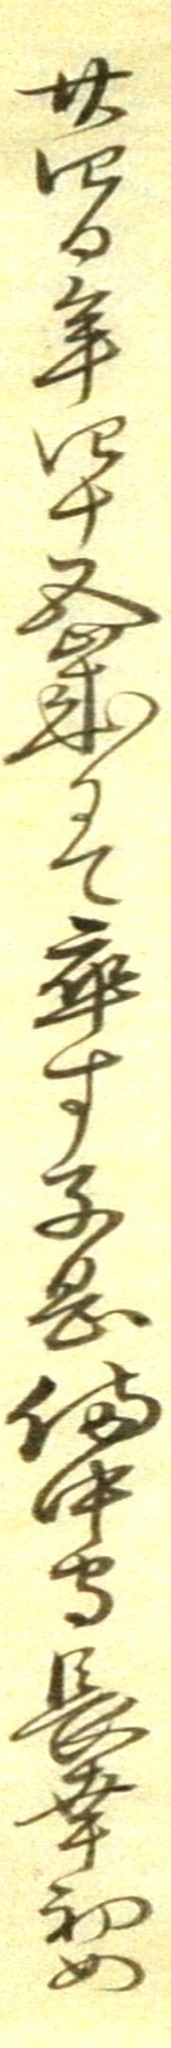廿四日年四十五歳にて卒す子息備中守長幸初め
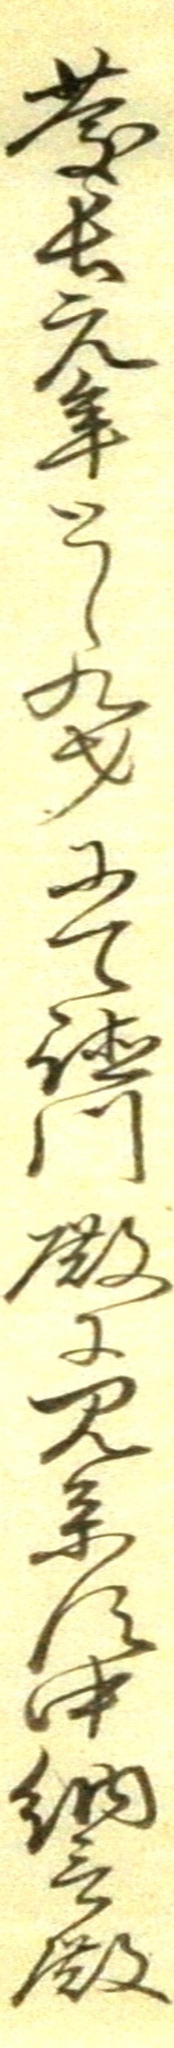慶長元年とし九才にて徳川殿に見参す中納言殿
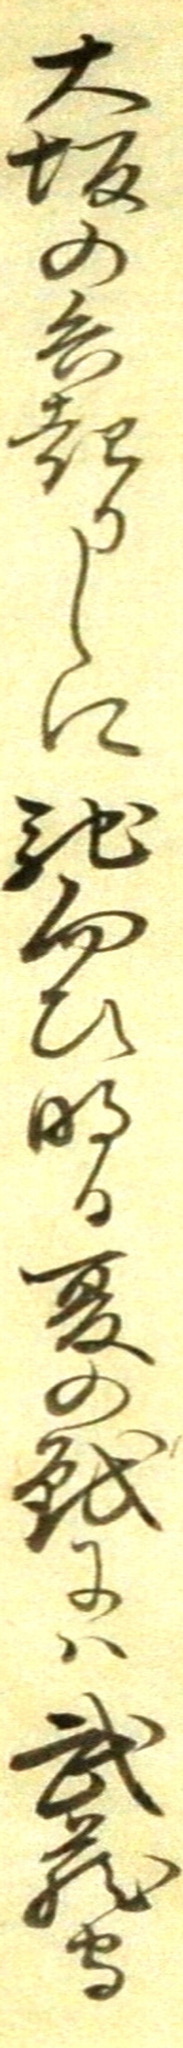大坂の兵起りしに馳向ひ明る夏の戦には武蔵守
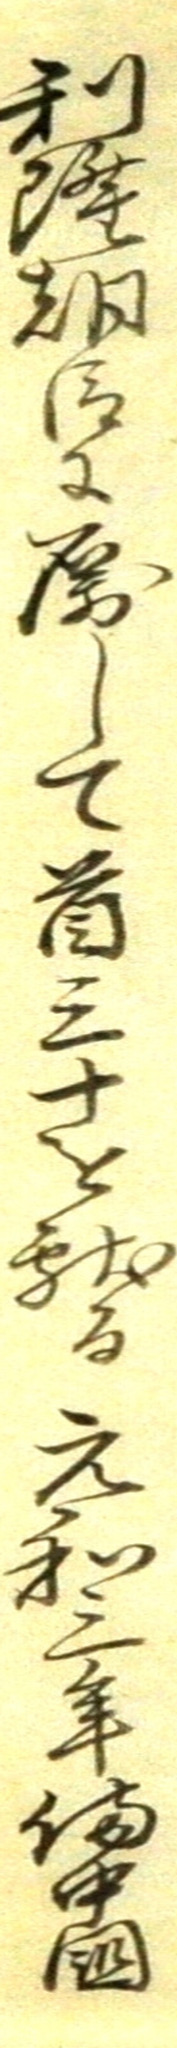利隆朝臣に属して首三十を献る元和三年備中国

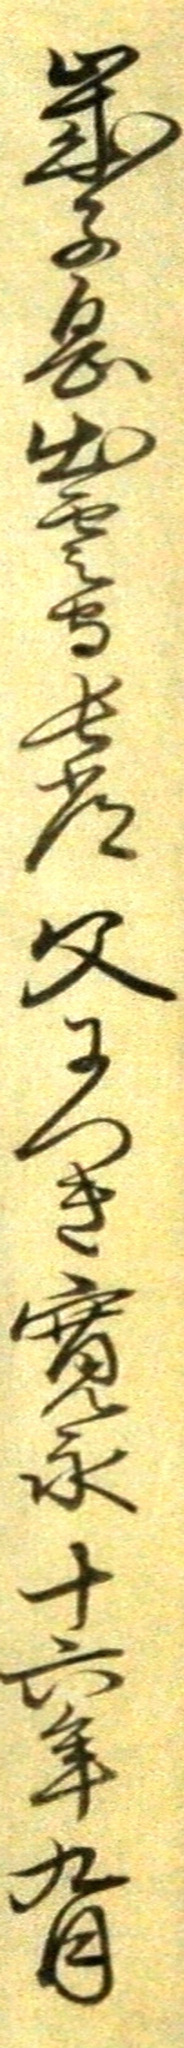歳子息出雲守長常父につき寛永十六年九月
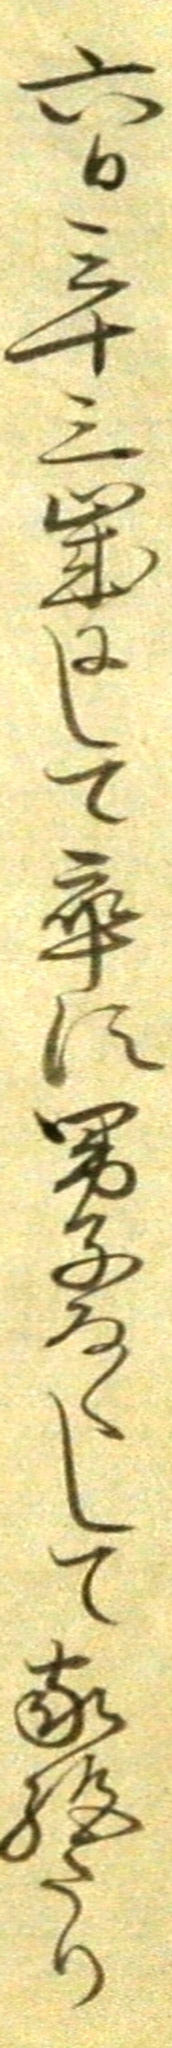六日三十三歳にして卒す男子なくして家絶たり
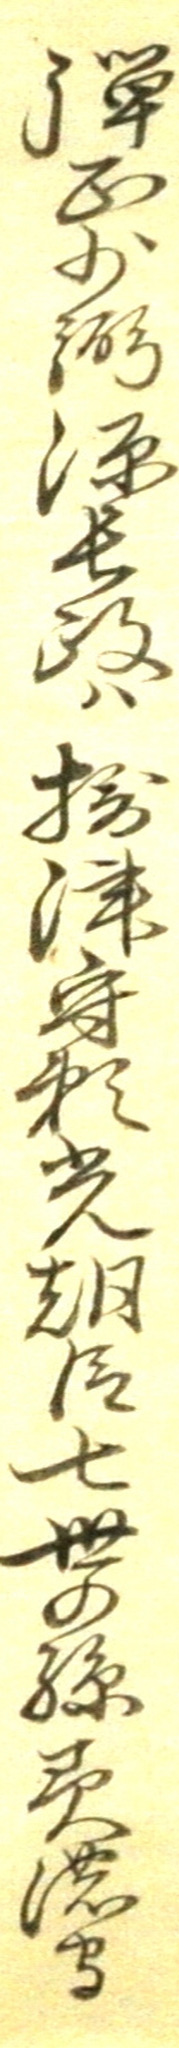弾正少弼源長政は摂津守頼光朝臣七世の孫美濃守
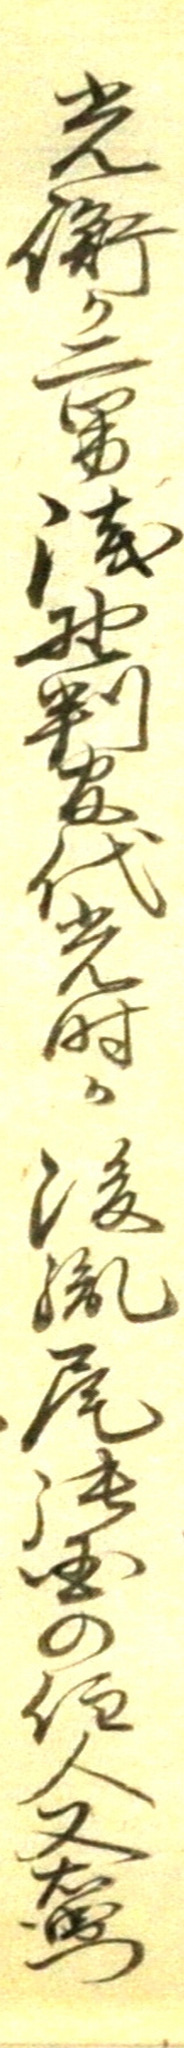光衡か二男浅野判官代光時か後胤尾張国の住人又右衛門
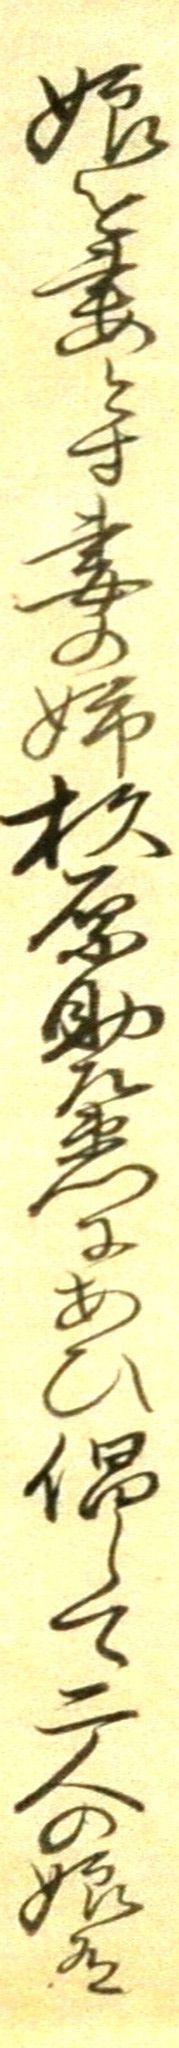娘を妻とす妻の姉杉原助左衛門にあひ倡して二人の娘有
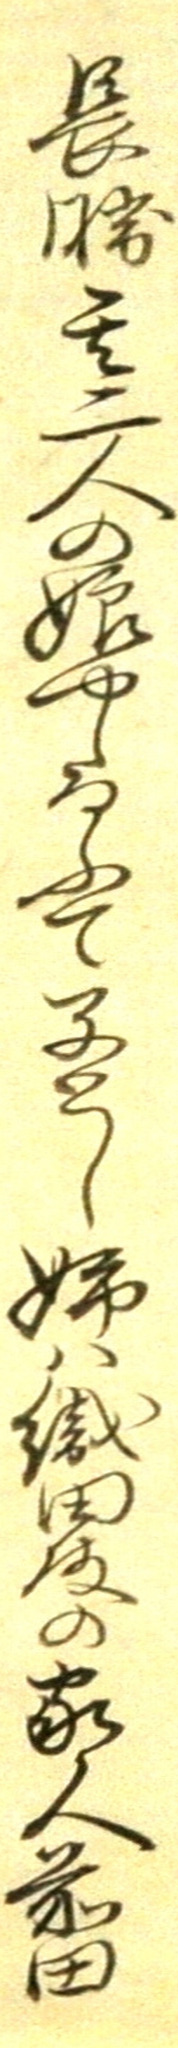長勝其二人の娘やしなふて子とし姉は織田殿の家人前田

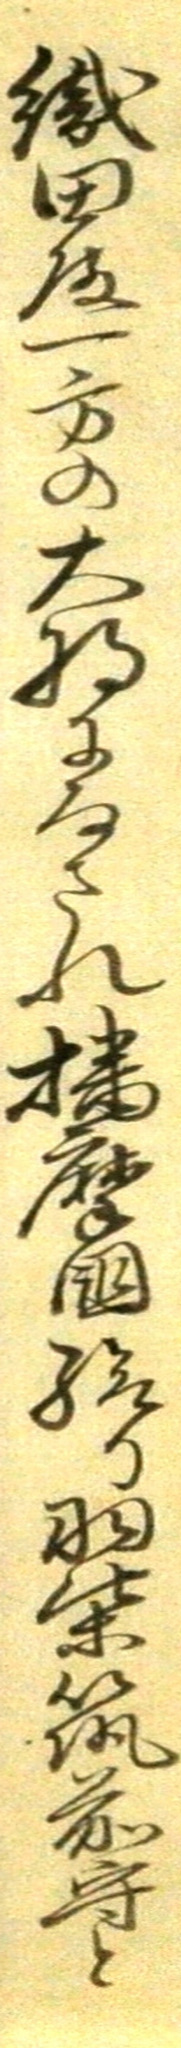織田殿一方の大将になされ播磨国給り羽柴筑前守と
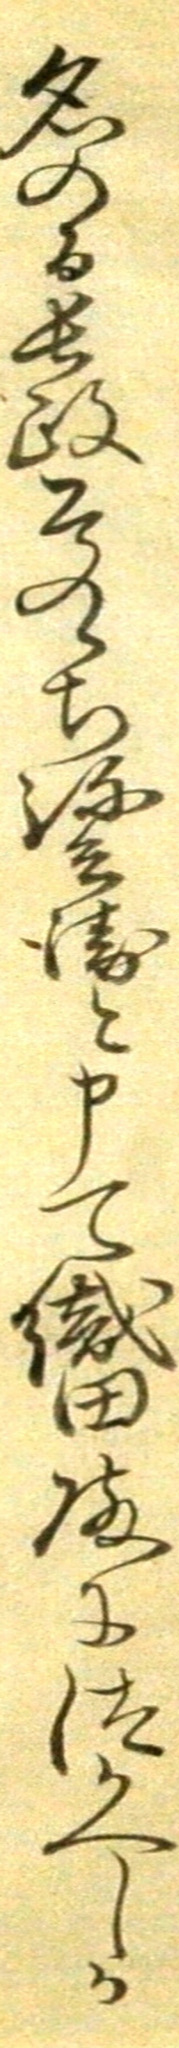名のる長政そのゝち弥兵衛と申て織田殿につかへしか
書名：藩翰譜（七・上）
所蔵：伊那市立高遠町図書館・合同会社AMANE
